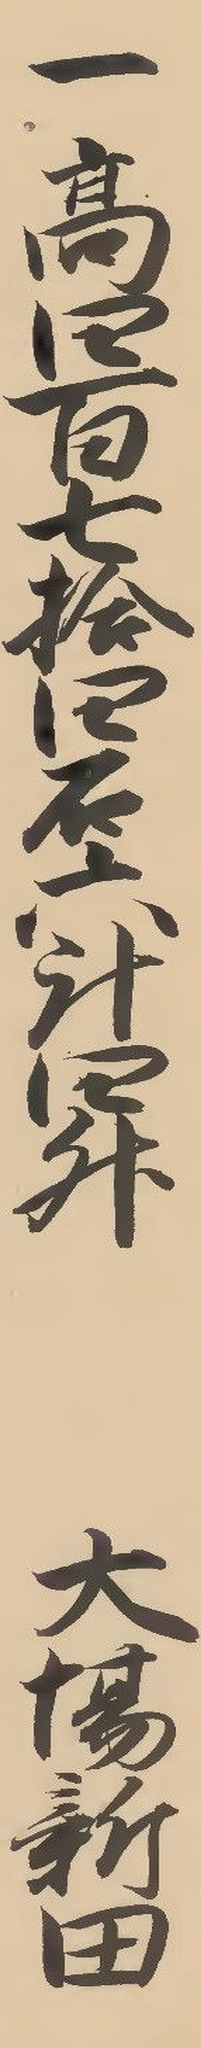一高四百七拾四石六斗四升大場新田
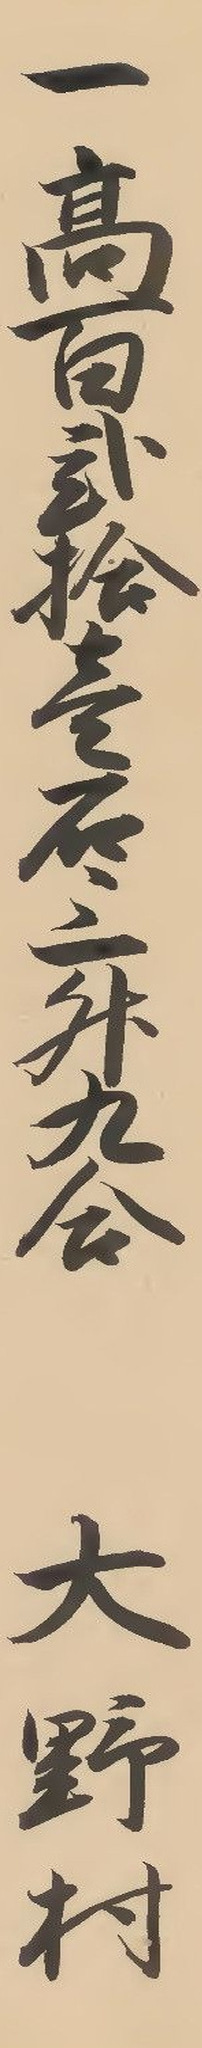一高百弐拾壱石三升九合大野村
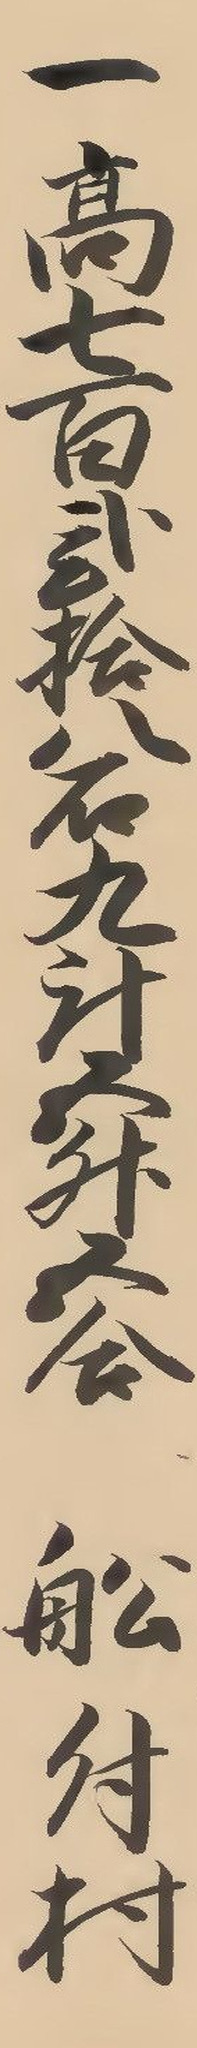一高七百弐拾八石九斗五升五合船付村
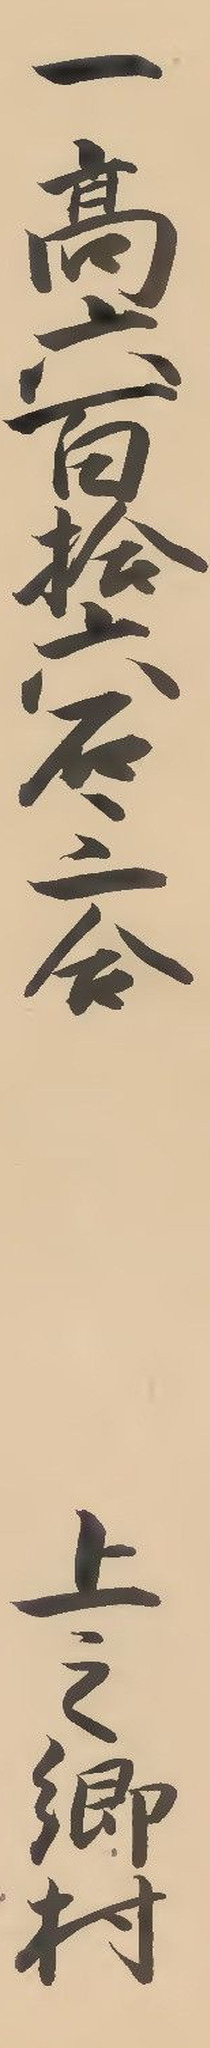一高六百拾六石三合上之郷村
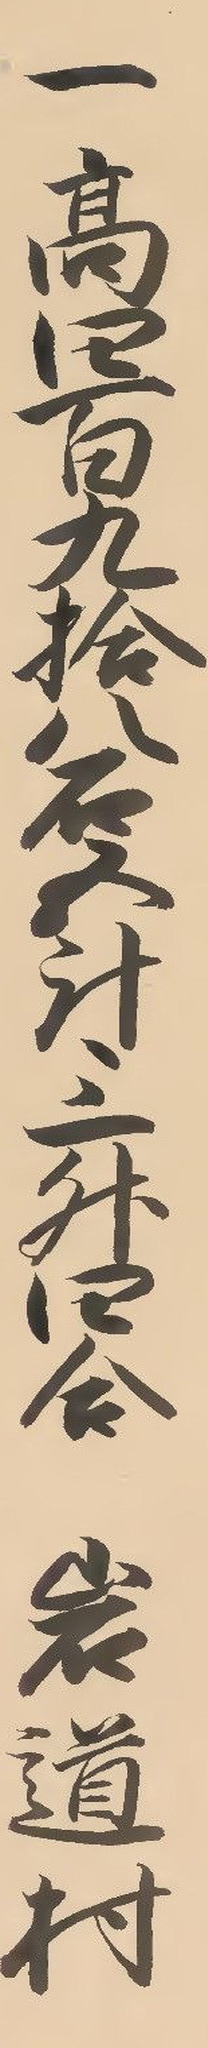一高四百九拾八石五斗三升四合岩道村
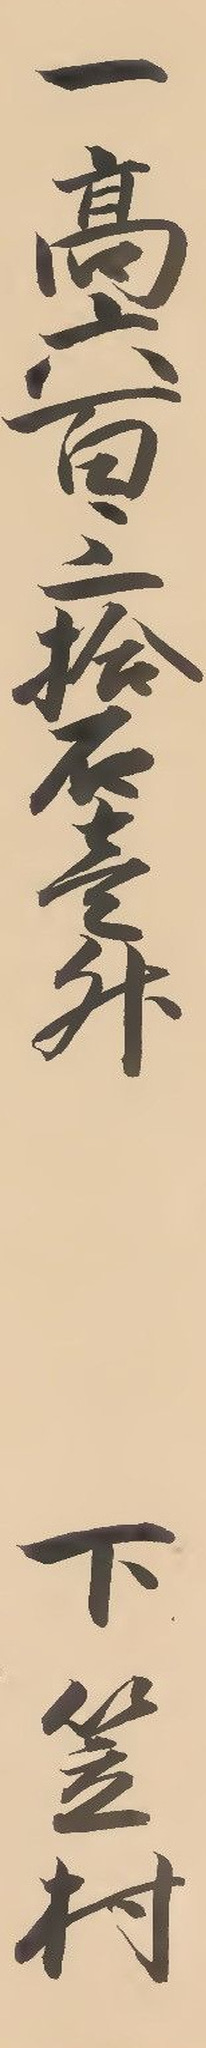一高六百三拾石壱升下笠村
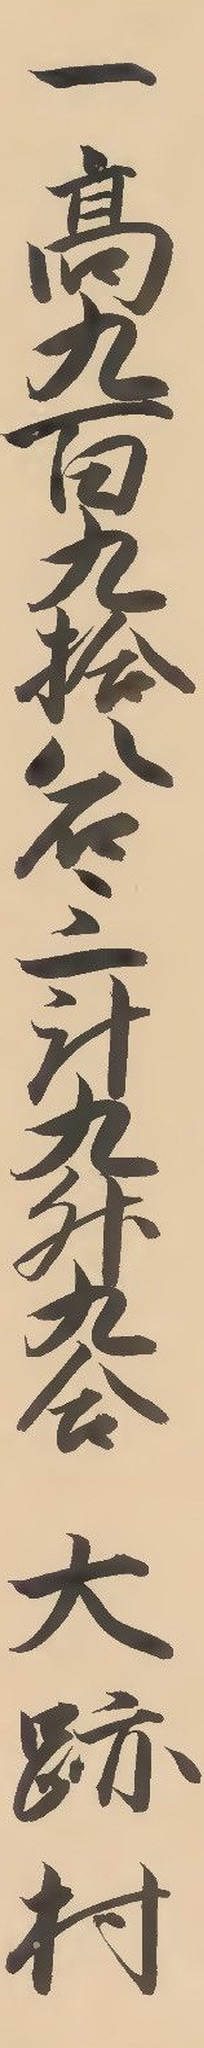一高九百九拾八石三斗九升九合大跡村
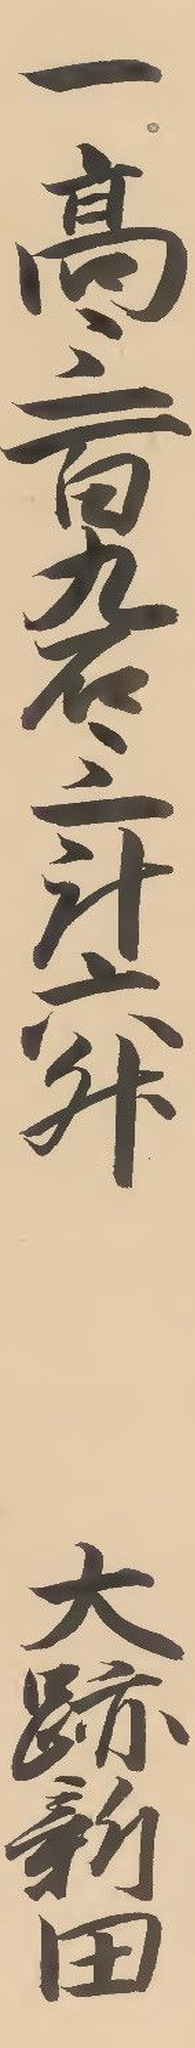一高三百九石三斗六升大跡新田

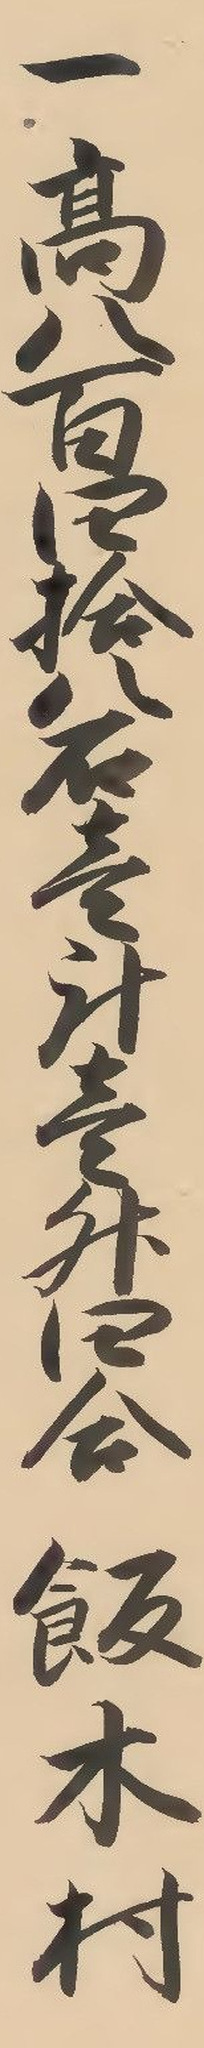一高八百四捨八石壱斗壱升四合飯木村
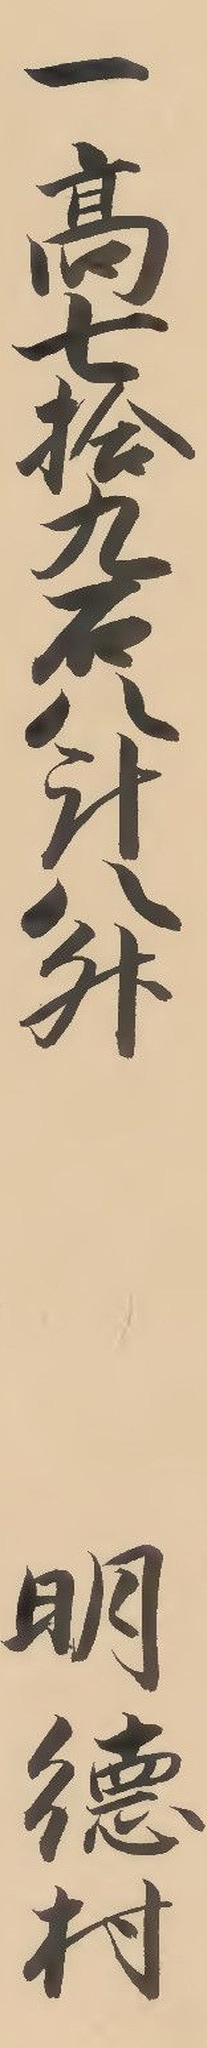一高七拾九石八斗八升明徳村
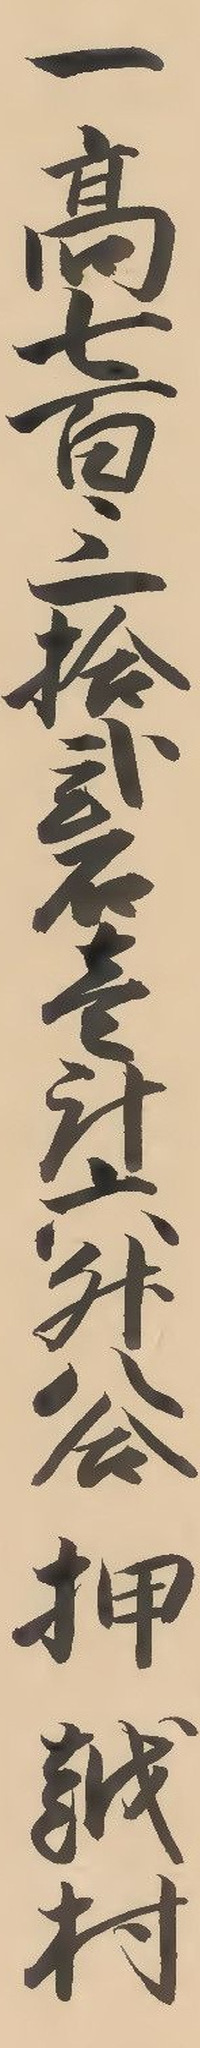一高七百三拾弐石壱斗六升八合押越村
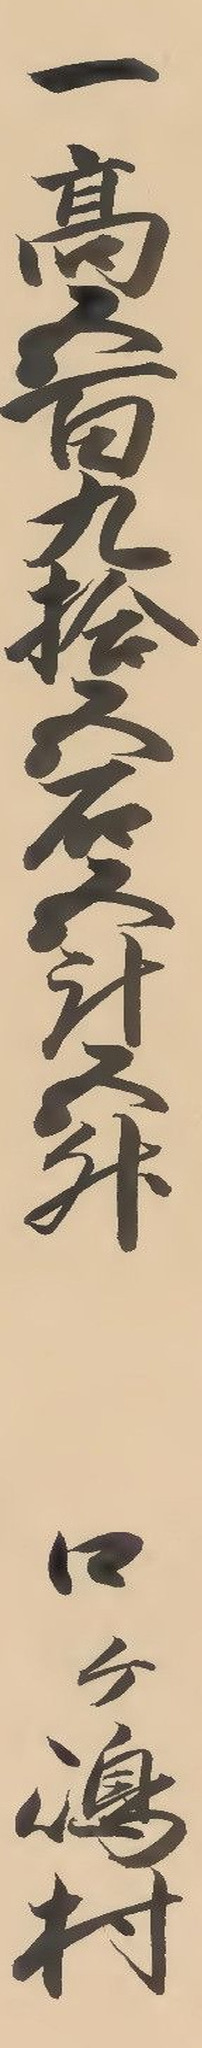一高五百九拾五石五斗五升口ヶ島村
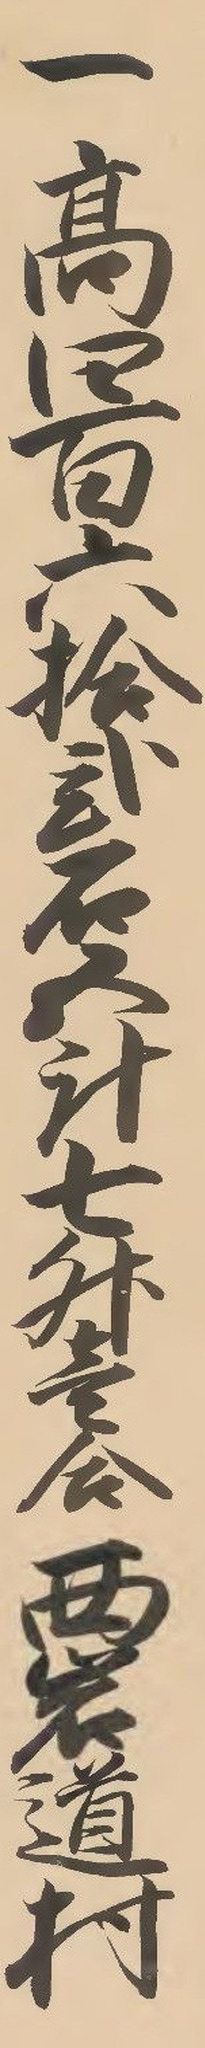一高四百六拾弐石五斗七升壱合西岩道村
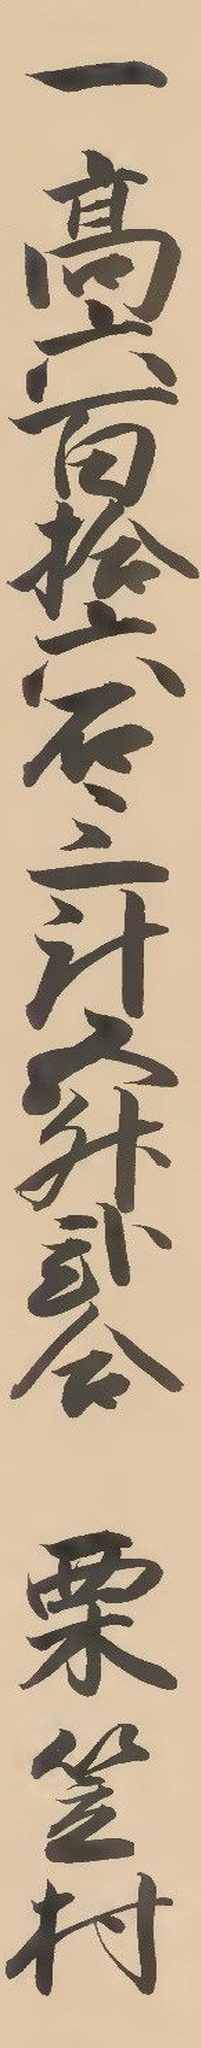一高六百拾六石三斗五升弐合栗笠村
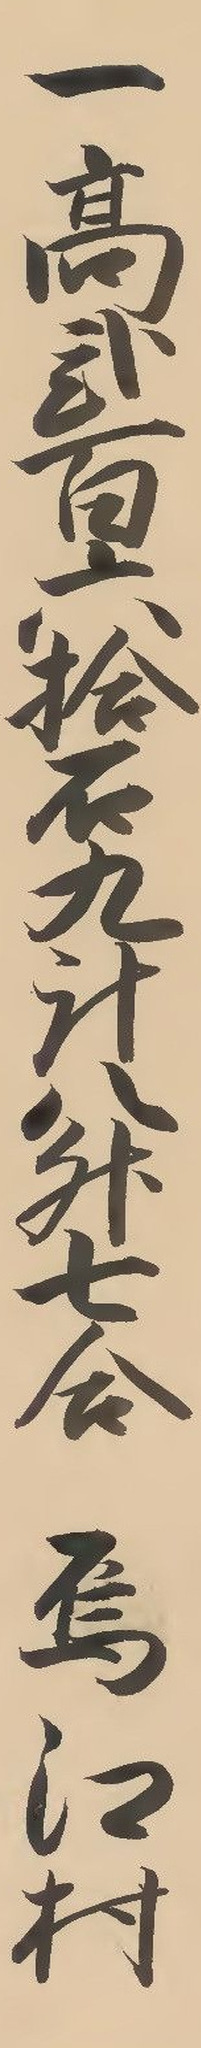一高弐百六拾石九斗八升七合烏江村
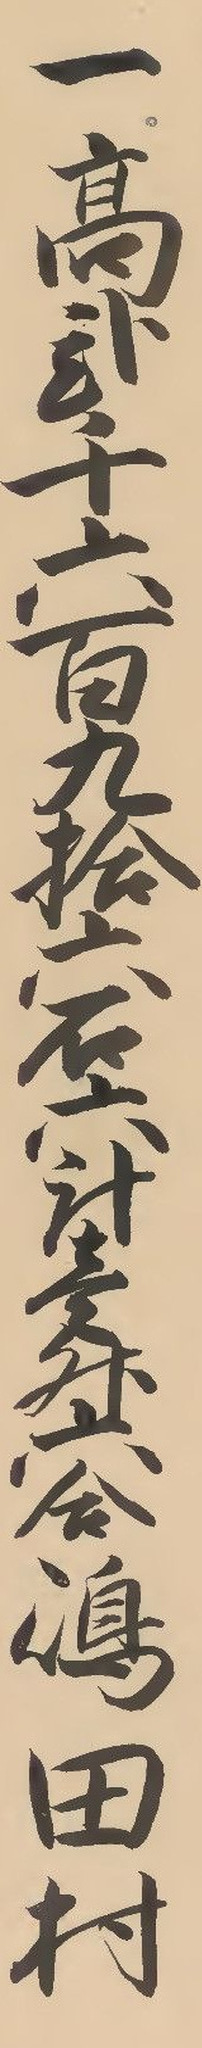一高弐千六百九拾六石六斗壱升六合島田村
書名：美濃国郷帳
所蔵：国立公文書館 National Archives of Japan
